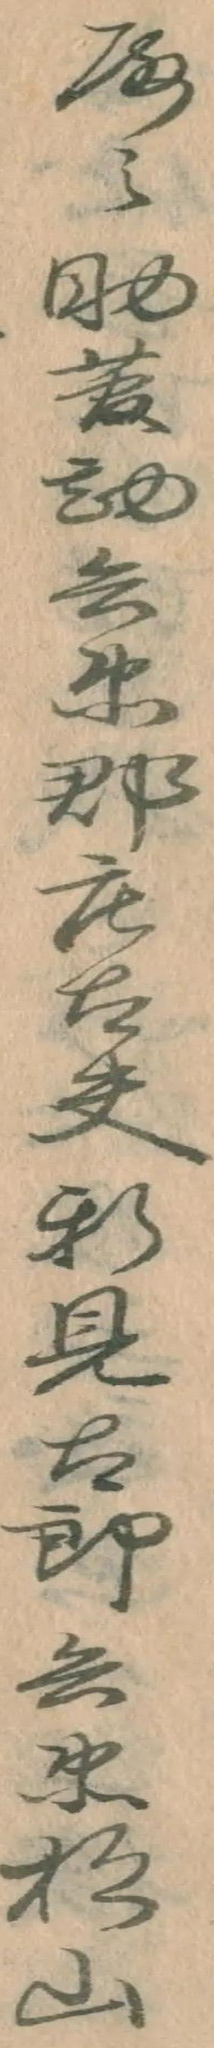殿之助菅勘兵衛郡庄太夫新見太郎兵衛杉山
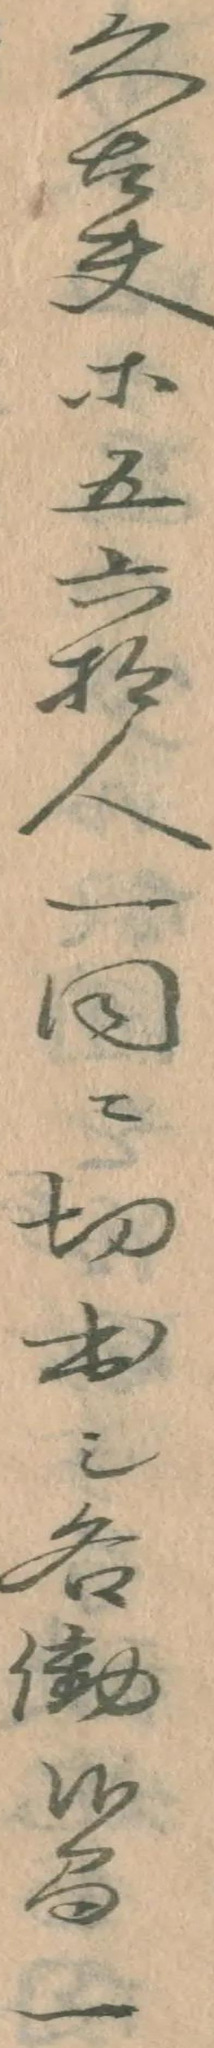久太夫等五六拾人一同に切出し各働候間一
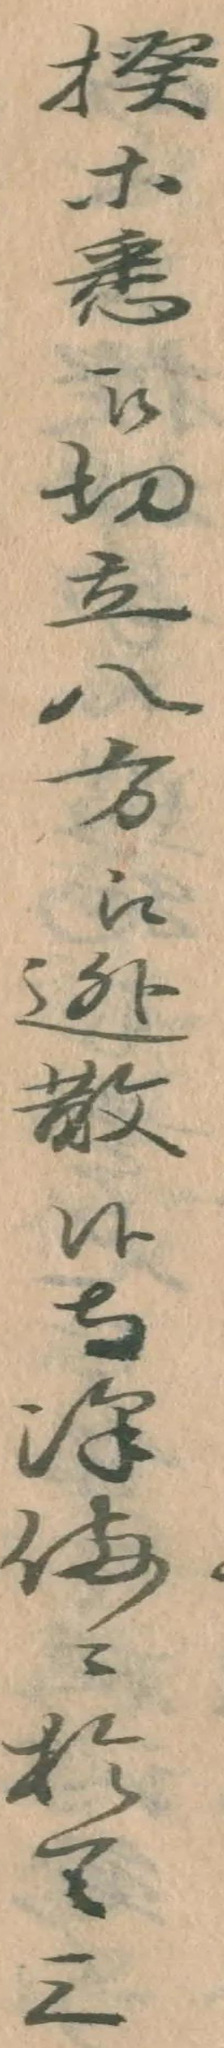揆等悉被切立八方江逃散候寺沢備に於て三
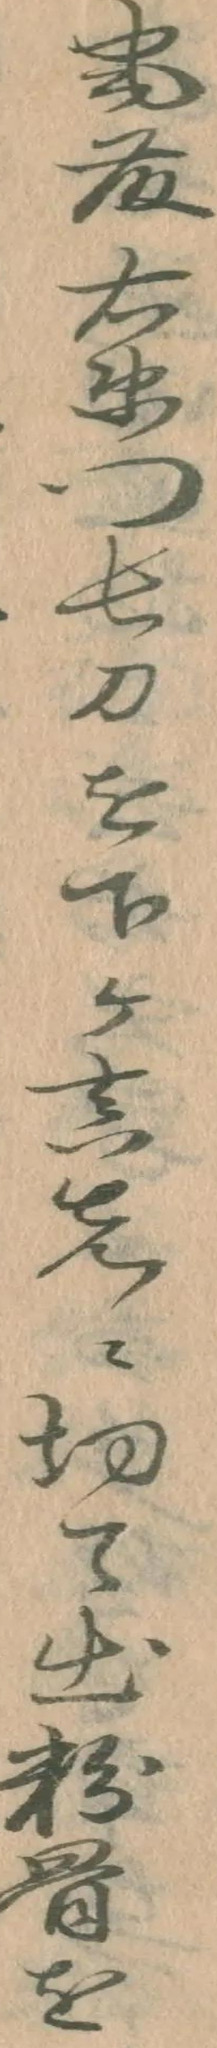宅藤右衛門長刀を下け其先に切て出粉骨を
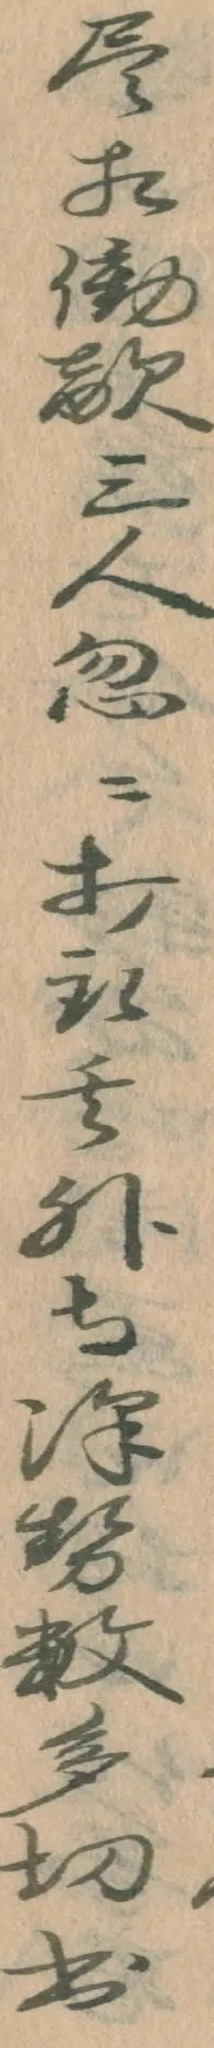尽相働敵三人忽に打取其外寺沢勢数多切出
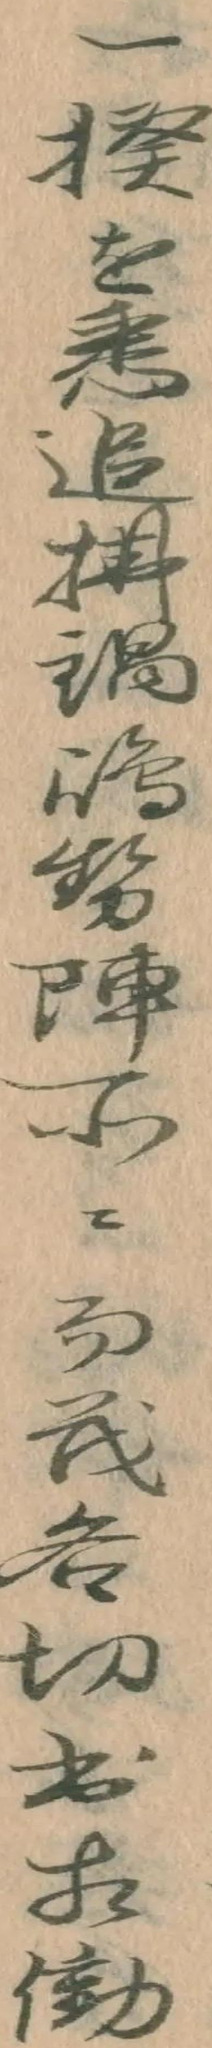一揆を悉追払鍋島勢陣所に而茂各切出相働
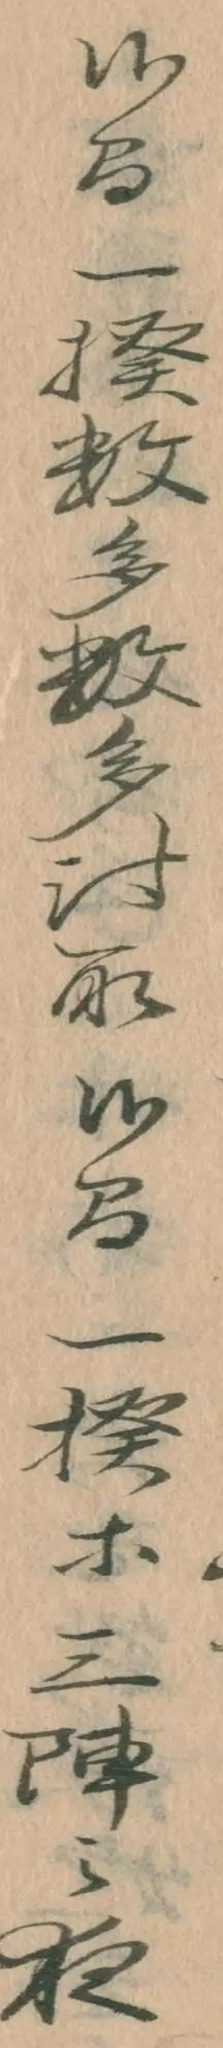候間一揆数多数多討取候間一揆等三陣之夜
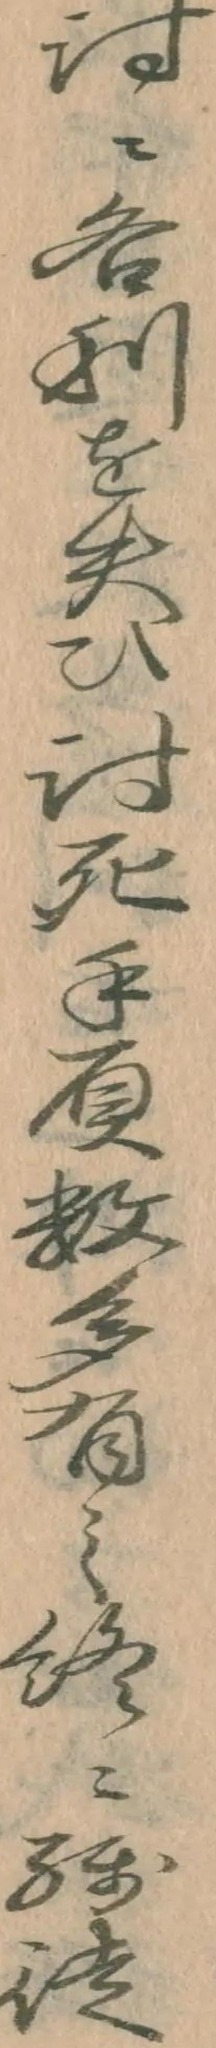討に各利を失ひ討死手負数多有之終に残徒
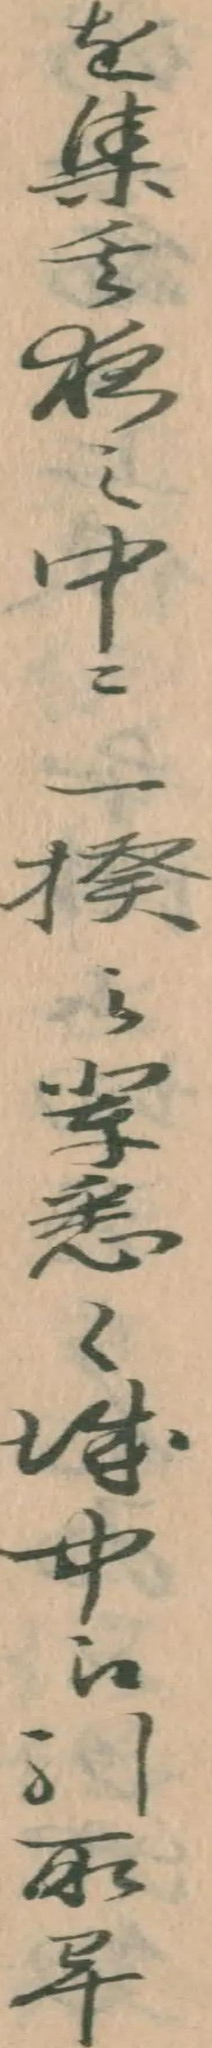を集其夜之中に一揆之輩悉く城中江引取畢
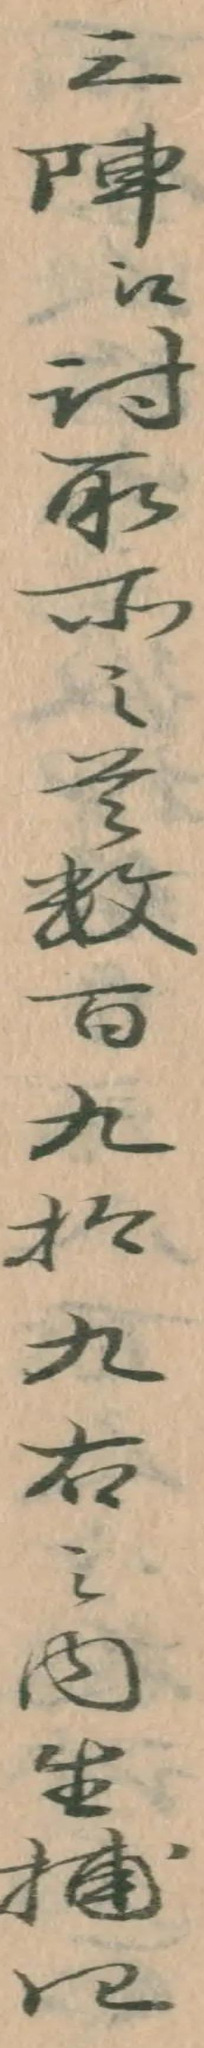三陣江討取所之首数百九拾九右之内生捕四
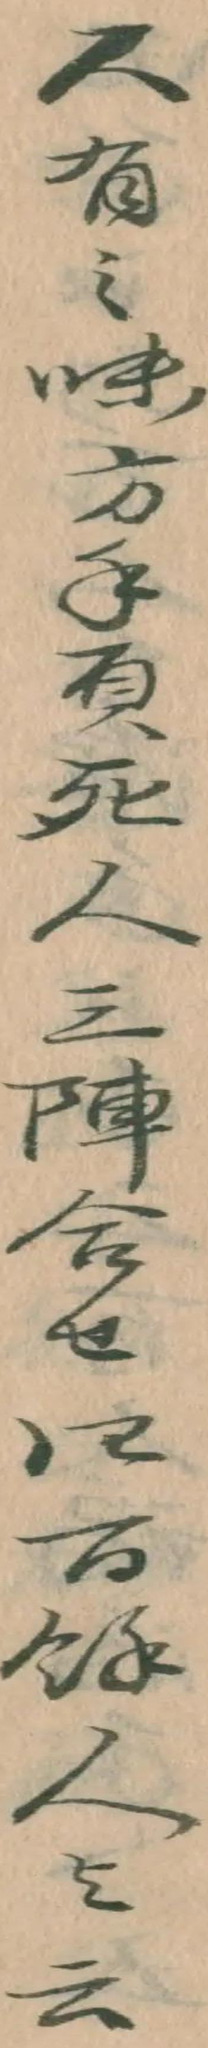人有之味方手負死人三陣合せ四百余人与云
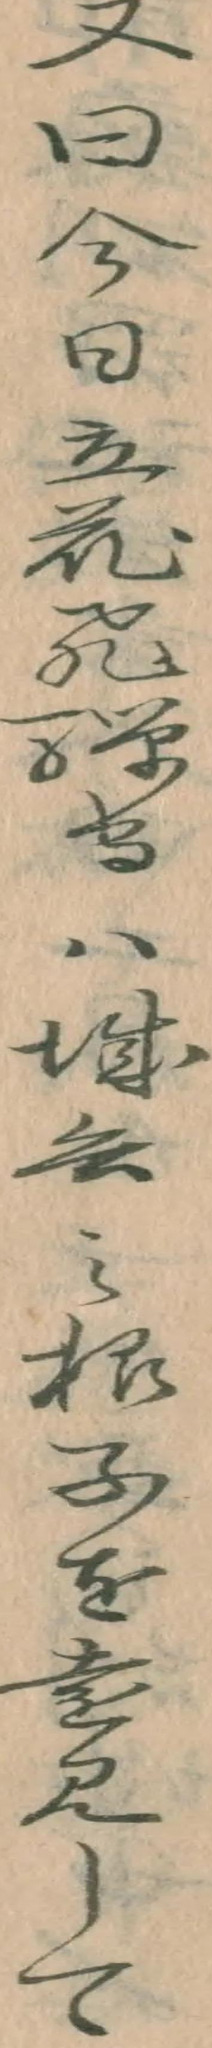又曰今日立花飛騨守は城兵之様子を遠見して
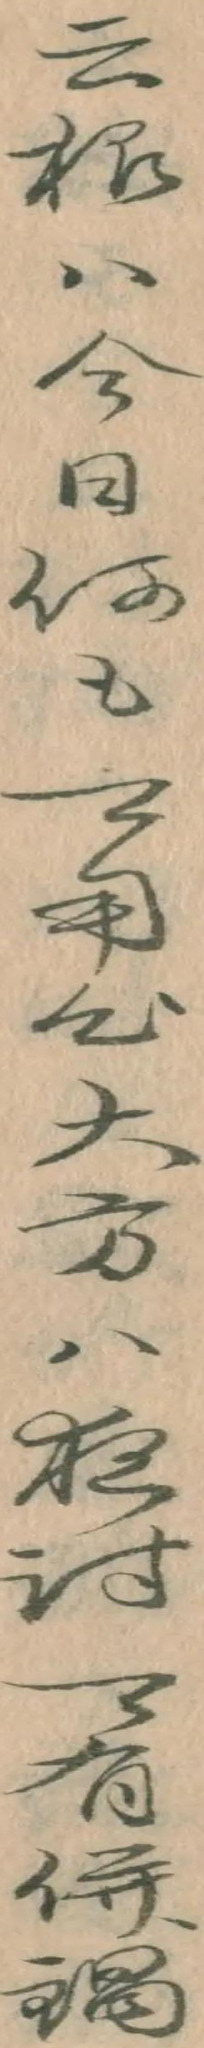云様は今日何も可用心大方は夜討可有併鍋
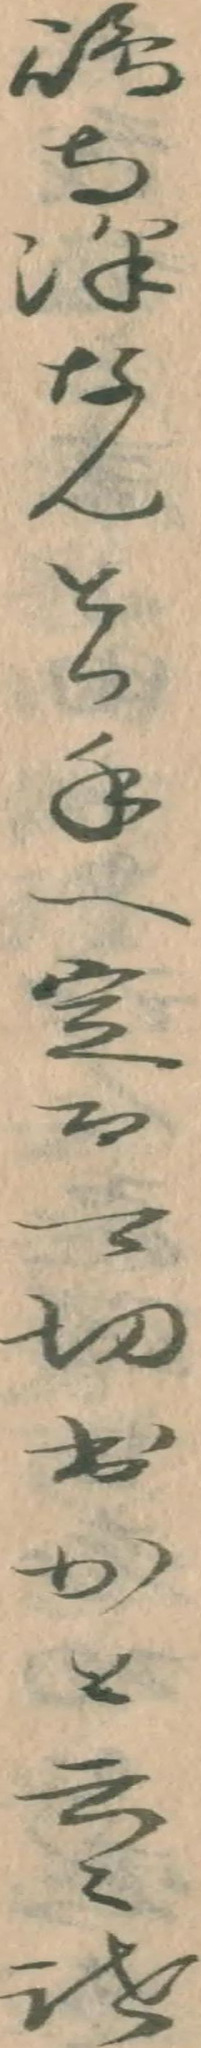島寺沢なんとか手へ定而可切出かと云々諸
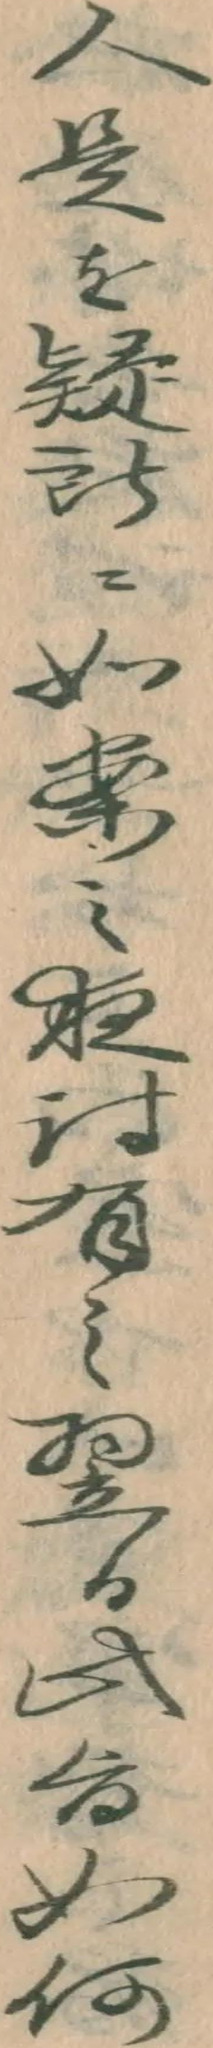人是を疑所に如案之夜討有之翌日此旨如何
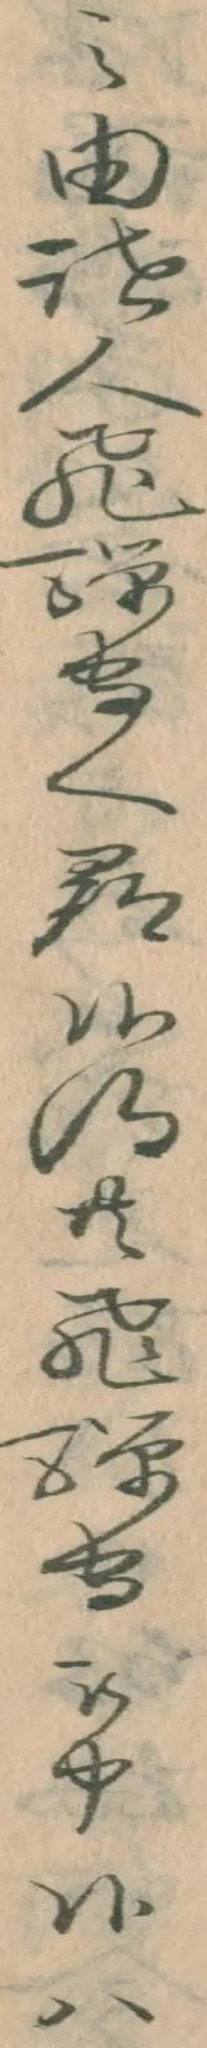之由諸人飛騨守へ尋候得共飛騨守被申候は
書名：切支丹御退治記 49巻. [7]
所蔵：国立国会図書館 National Diet Library, JAPAN
